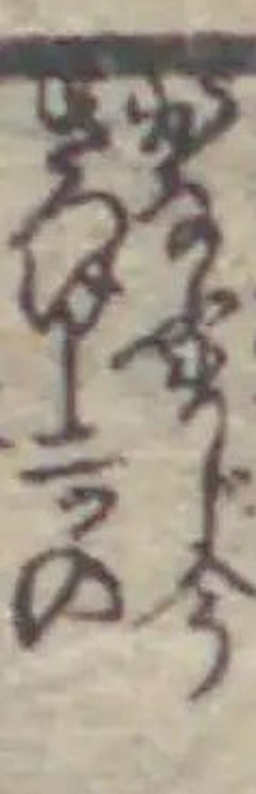さつけし二ツの
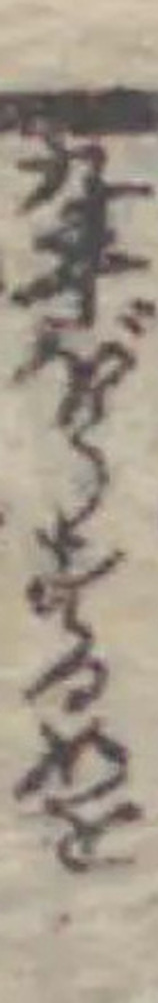九年ぼうするめを
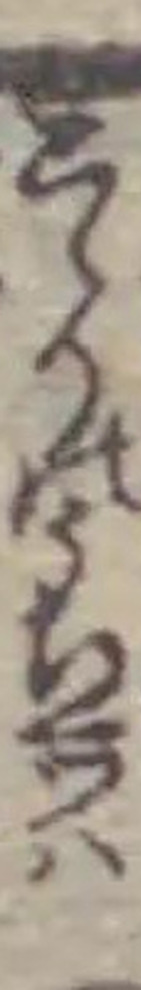こゝろのうち一ツは
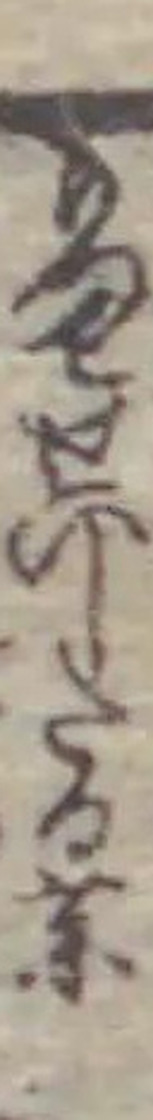もつてせいしたる薬
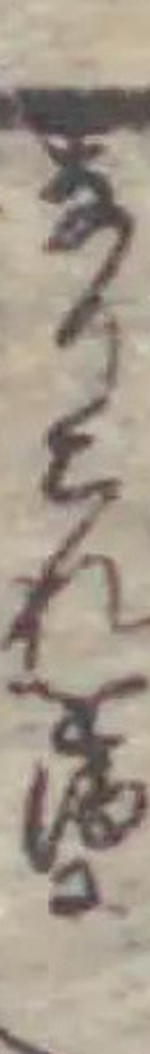なりこれを酒に
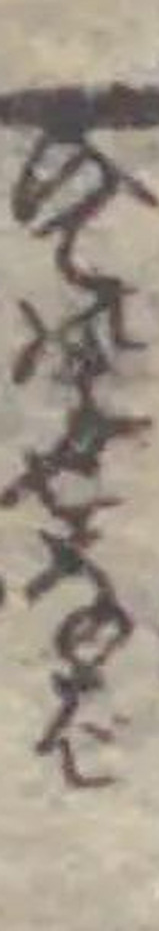入てのませなば
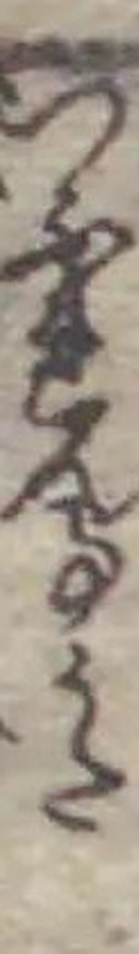つふれん事うた
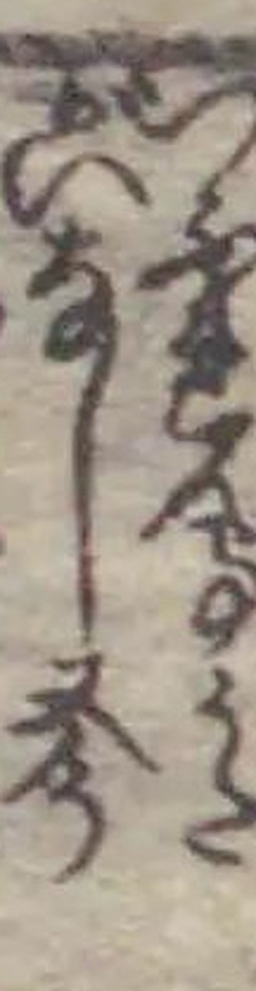がいなし又今
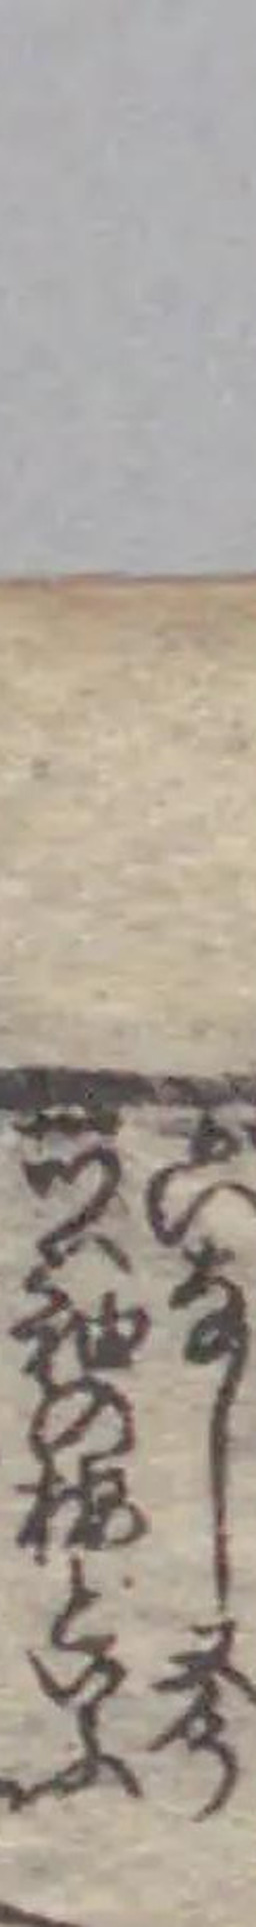一ツは袖の梅といふ
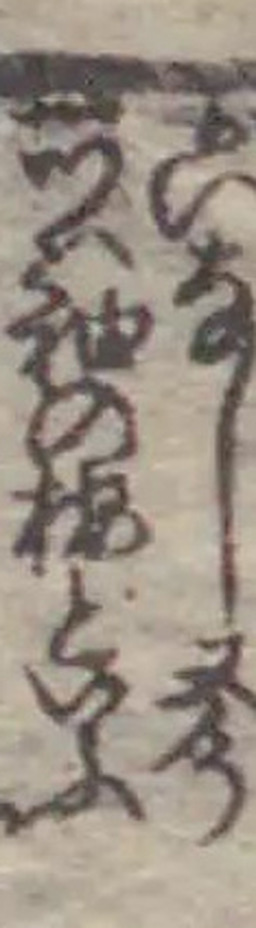一ツは袖の梅といふ
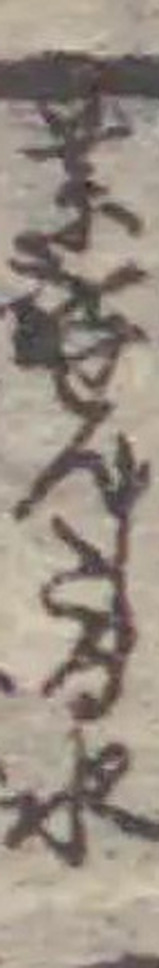薬をせんしたる水
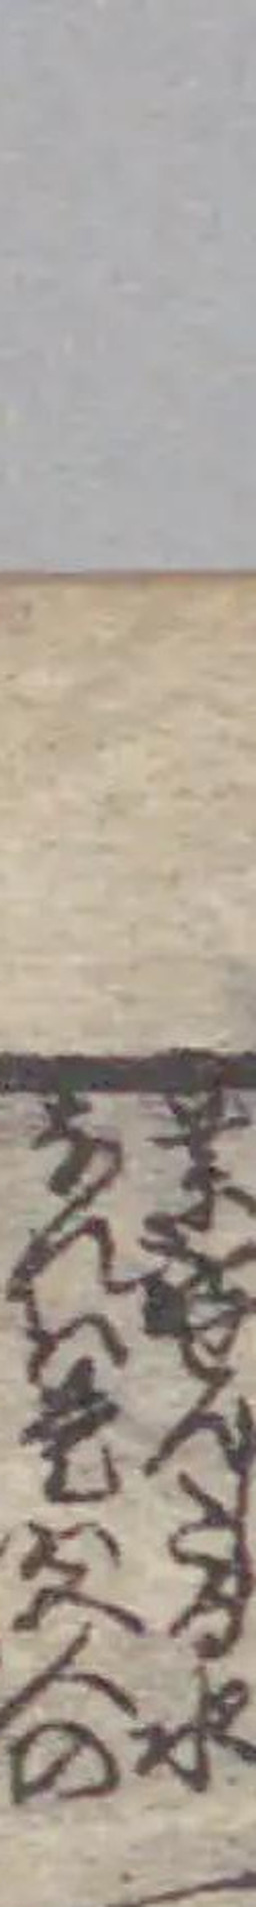なれは是は五人の
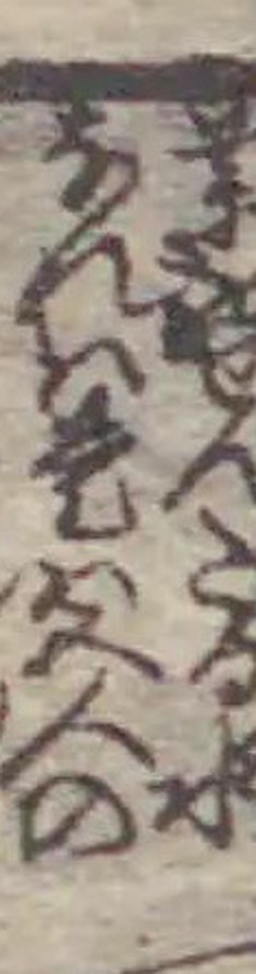なれは是は五人の
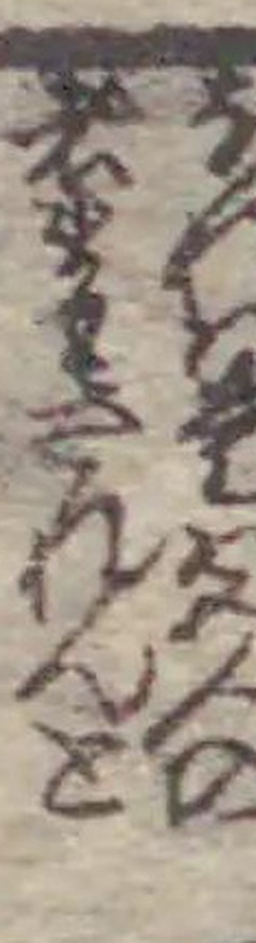者まわされんと
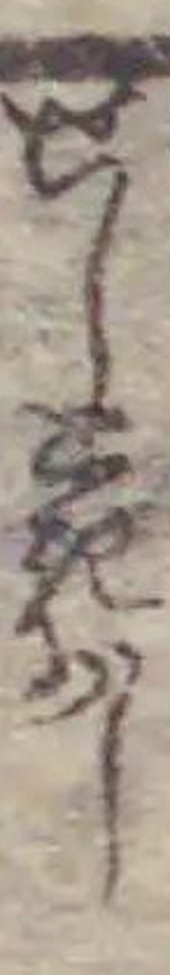せしとき少し
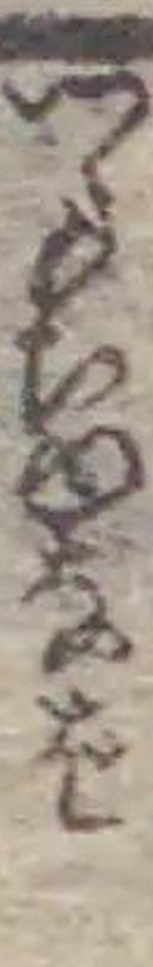つゝもちゐなば
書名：藝者五人娘 2巻
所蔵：国立国会図書館 National Diet Library, JAPAN
